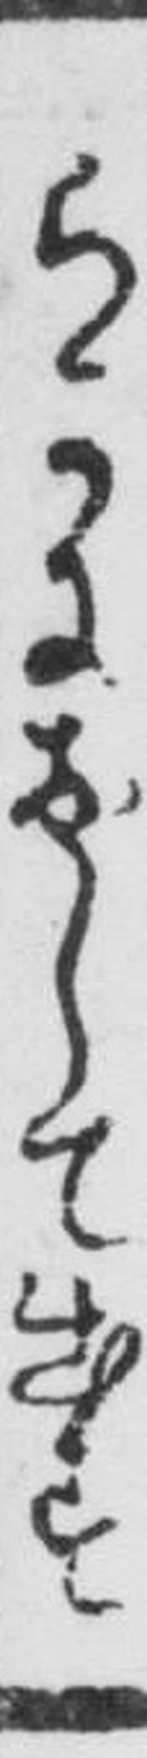らかにおして出す
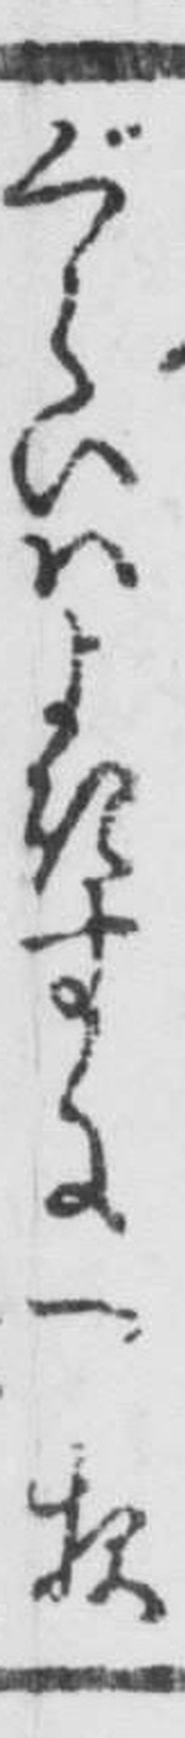ぐらいはよきすに一夜
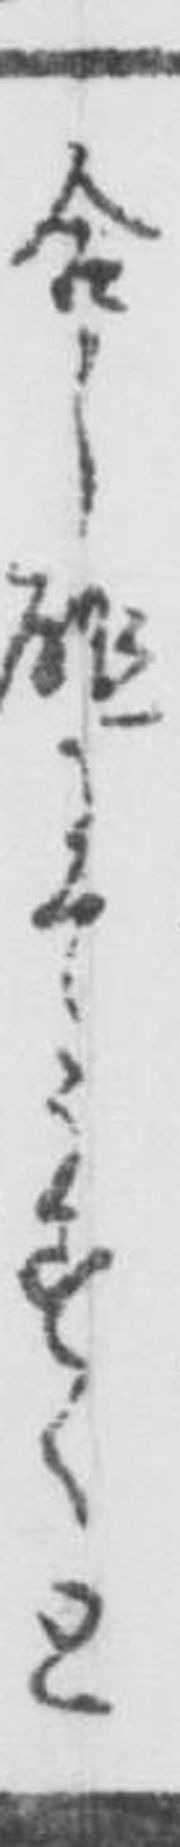合し酢にてうすくと
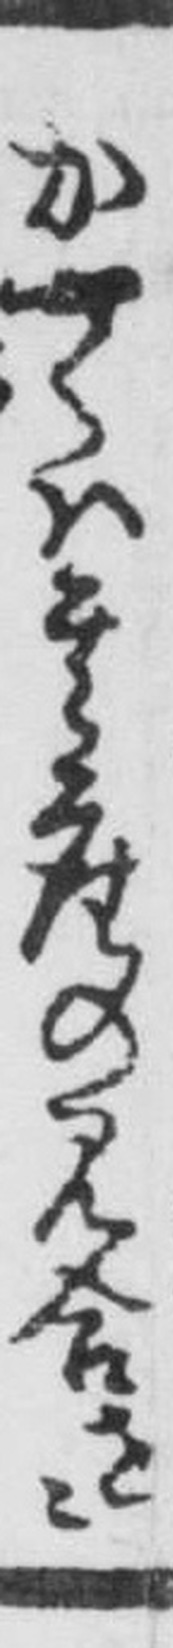かやくは其座の見合せに
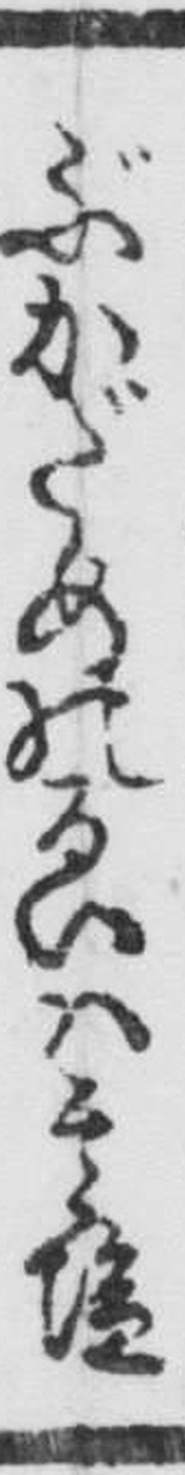ぶかごめのるいは其塩
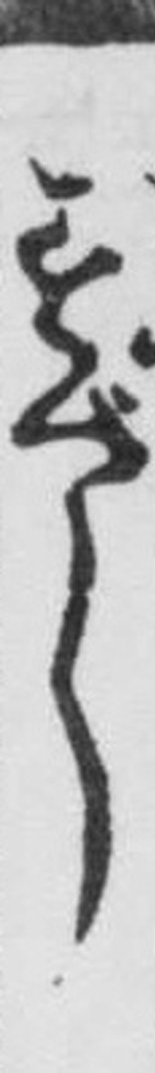すべし
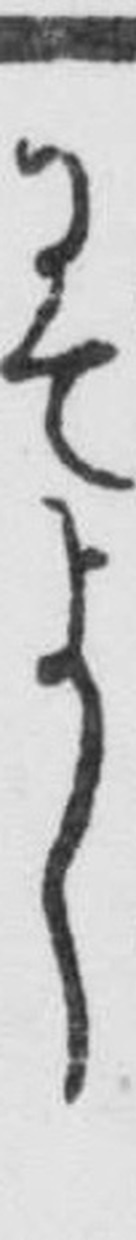にてよし
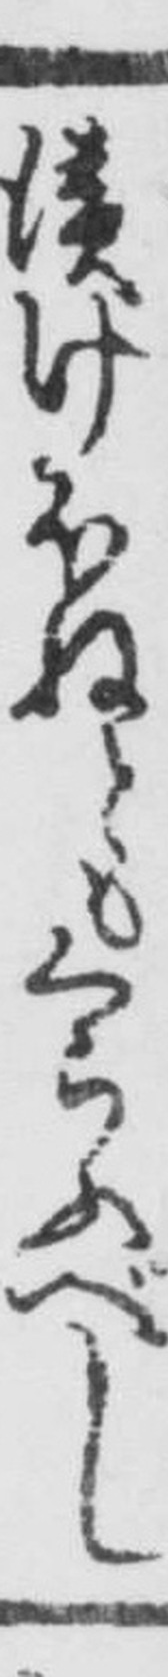漬けほねともくらふべし
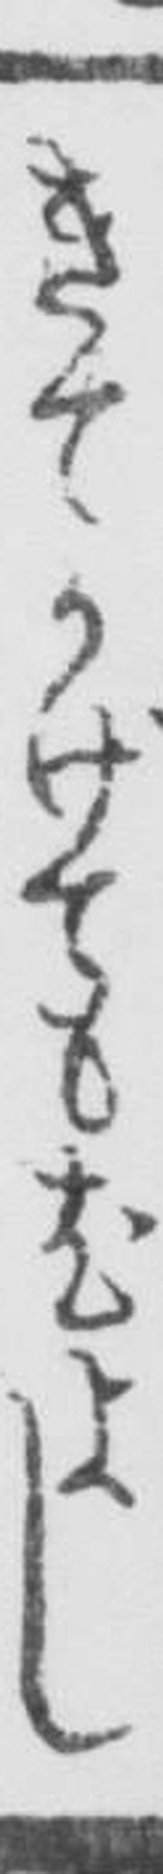きてかけても尤よし
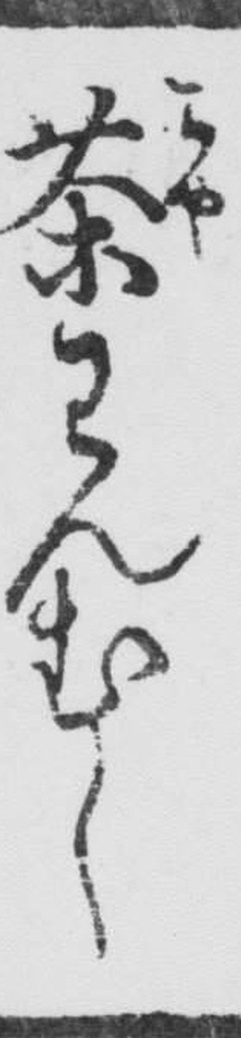茶わんむし
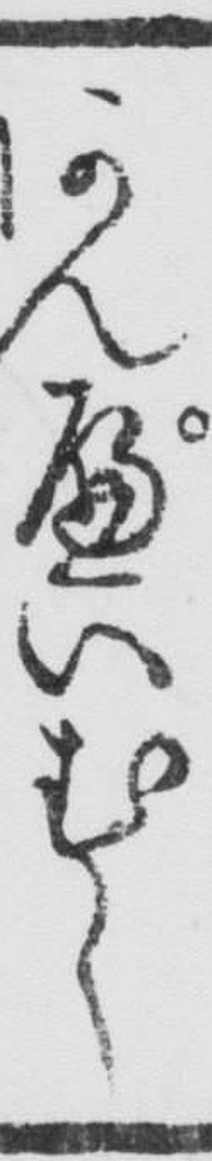あんぺいむし
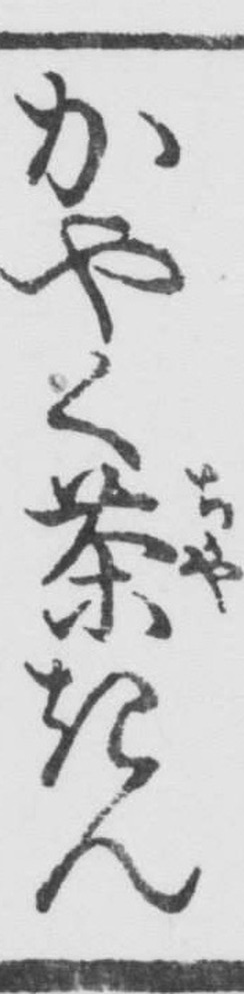かやく茶きん
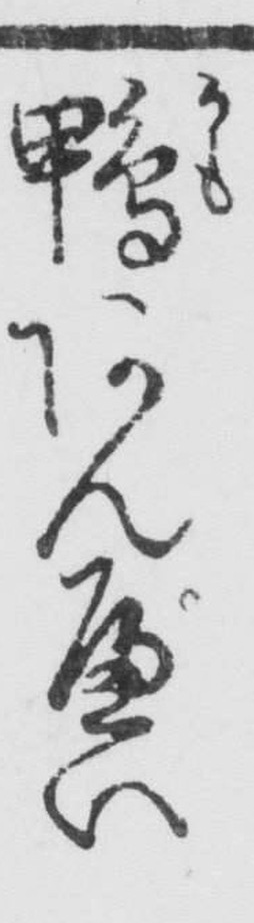鴨あんぺい
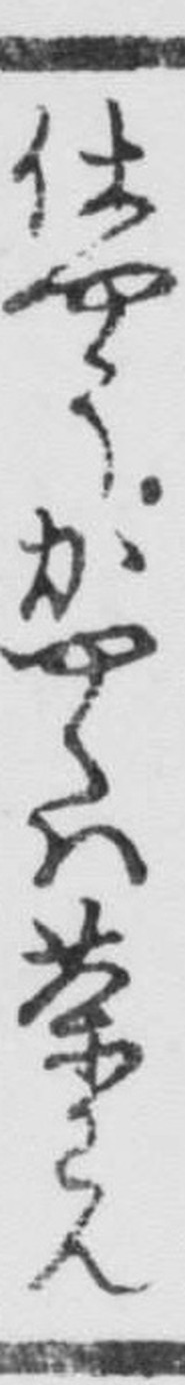仕やうかやくは茶わん
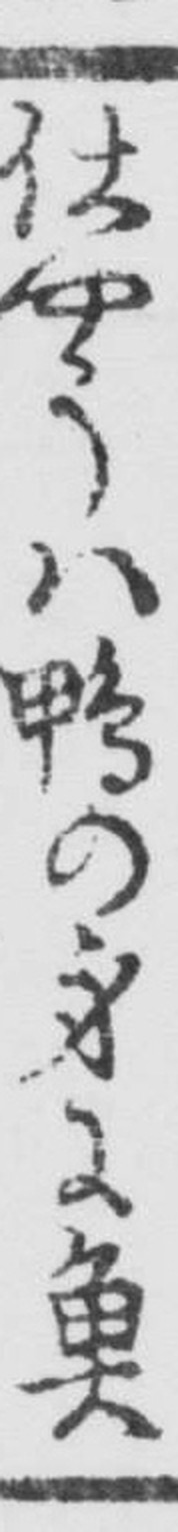仕やうは鴨の身に魚
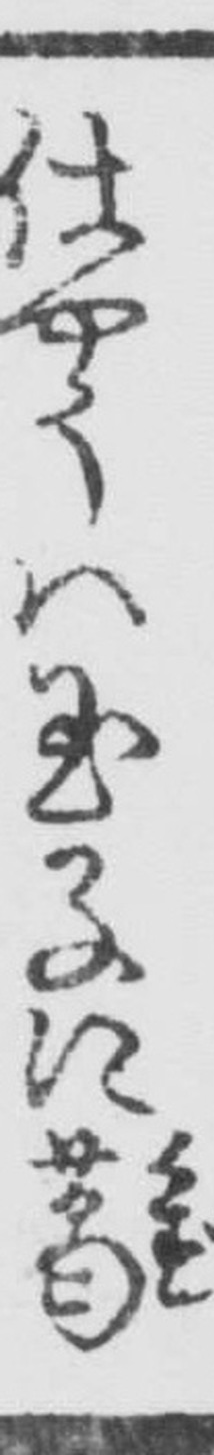仕やうは玉子に葛
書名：諸家通用/即席料理
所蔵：大阪府立大学学術情報センター 国文学研究資料館
